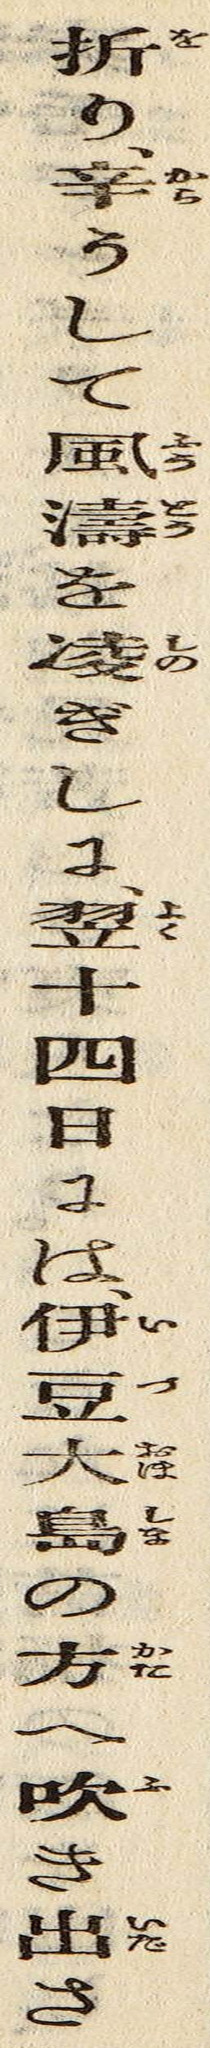折り、辛うして風濤を凌ぎしに、翌十四日には、伊豆大島の方へ吹き出さ
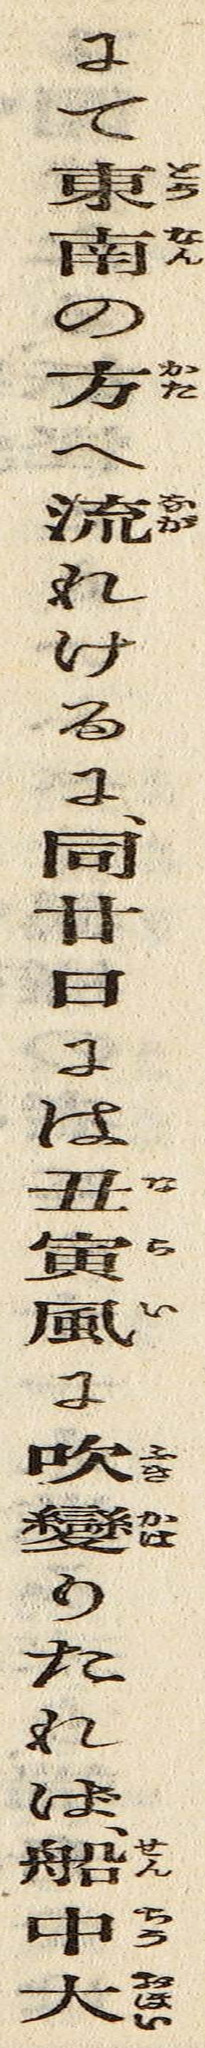にて東南の方へ流れけるに、同廿日には丑寅風に吹変りたれば、船中大
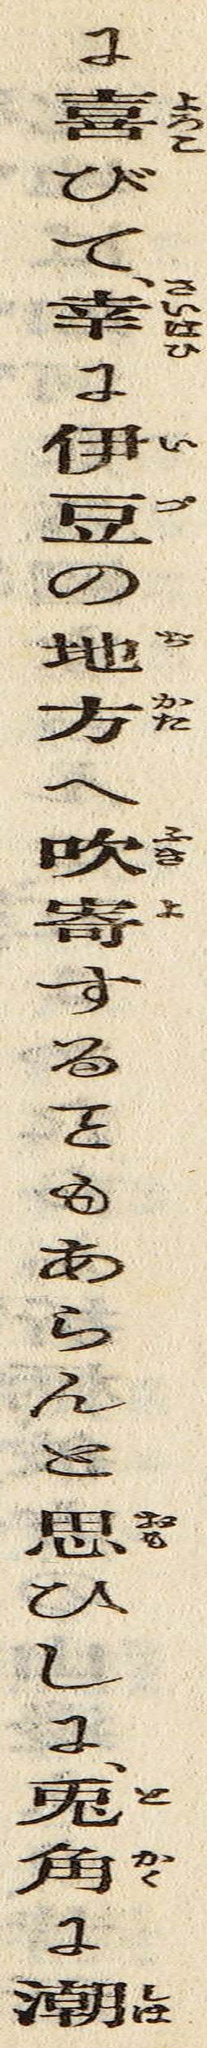に喜びて、幸に伊豆の地方へ吹寄することもあらんと思ひしに、兎角に潮
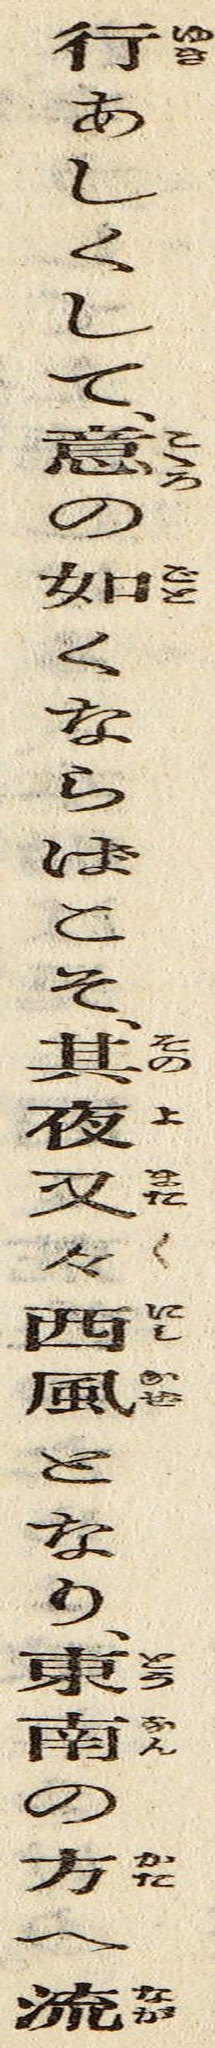行あしくして意の如くならばこそ、其夜又々西風となり、東南の方へ流
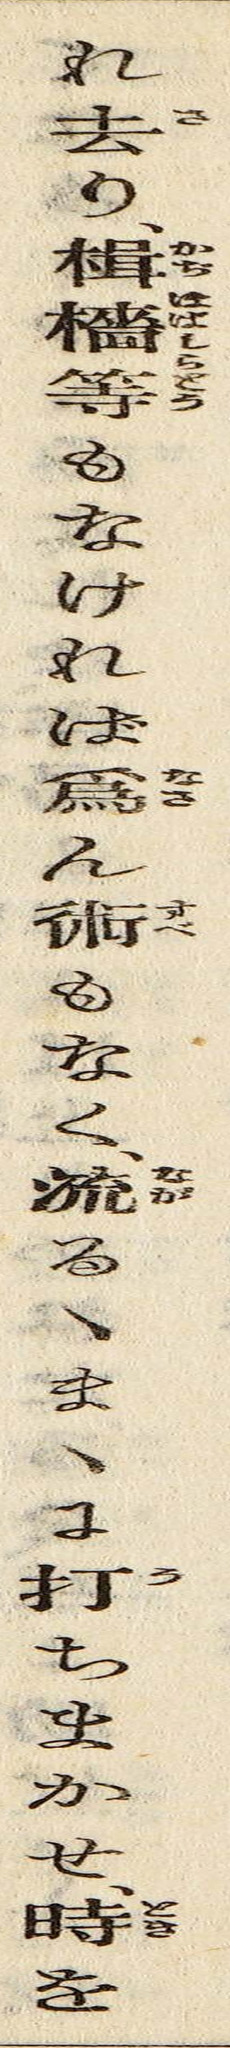れ去り、楫檣等もなければ為ん術もなく、流るゝまゝに打ちまかせ、時を
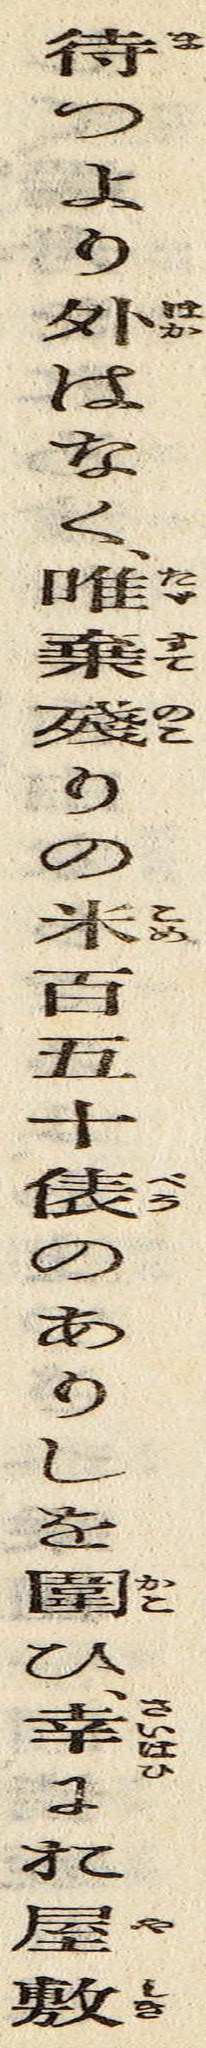待つより外はなく、唯棄残りの米百五十俵のありしを囲ひ、幸にお屋敷
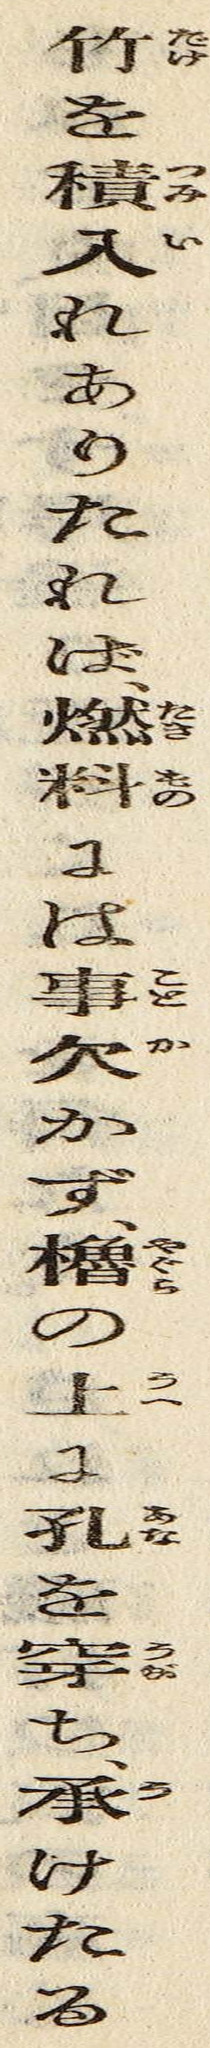竹を積入れありたれば、燃料には事欠かず、櫓の上に孔を穿ち、承けたる
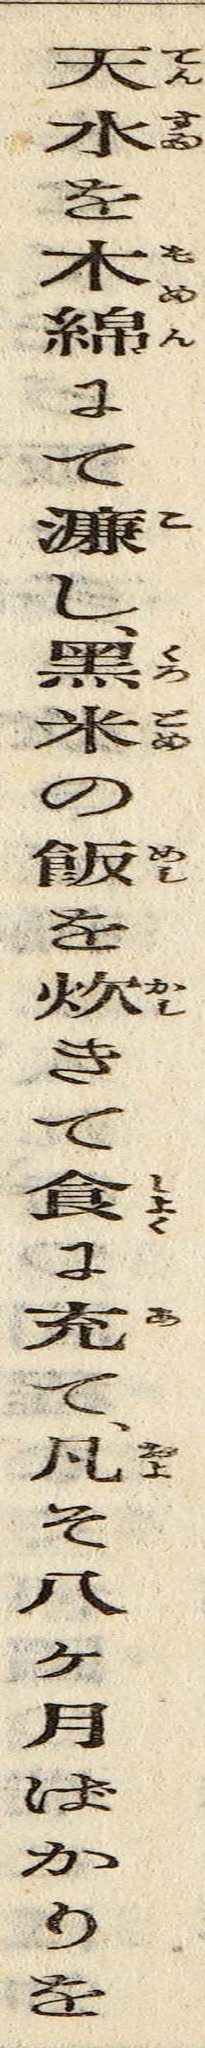天水を木綿にて濂し、黒米の飯を炊きて食に充て、凡そ八ヶ月ばかりを
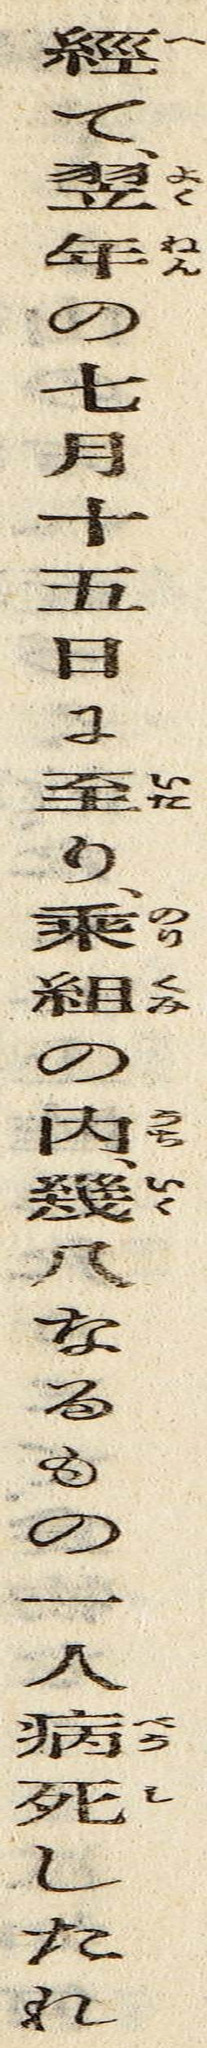経て翌年の七月十五日に至り、乗組の内、幾八なるもの一人病死したれ
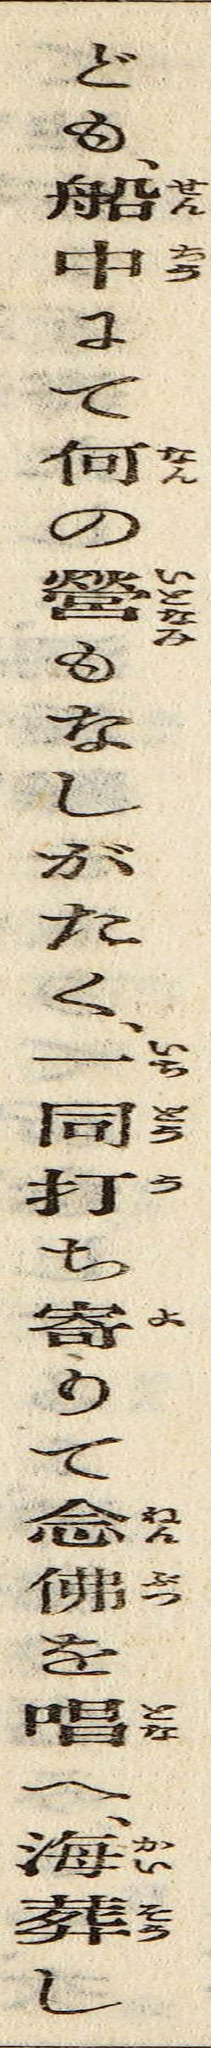とも、船中にて何の営もなしがたく、一同打ち寄りて念仏を唱へ、海葬し
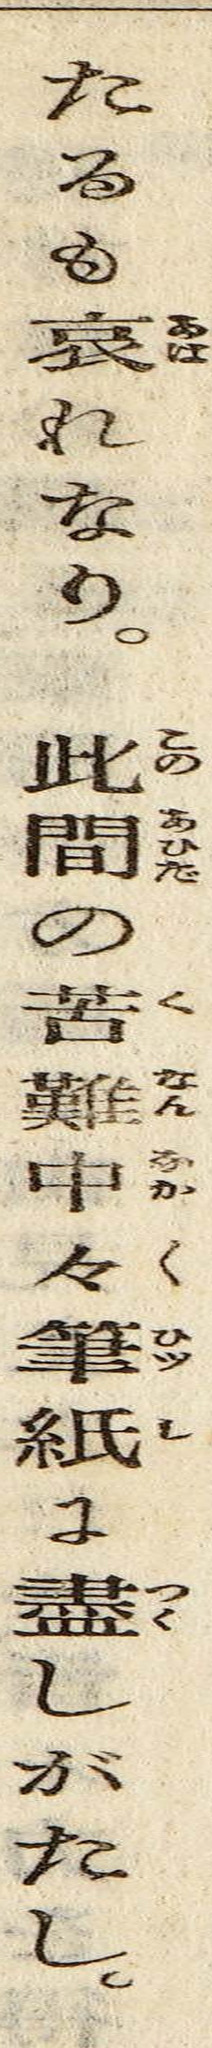たるも哀れなり。此間の苦難中々筆紙に尽しがたし。

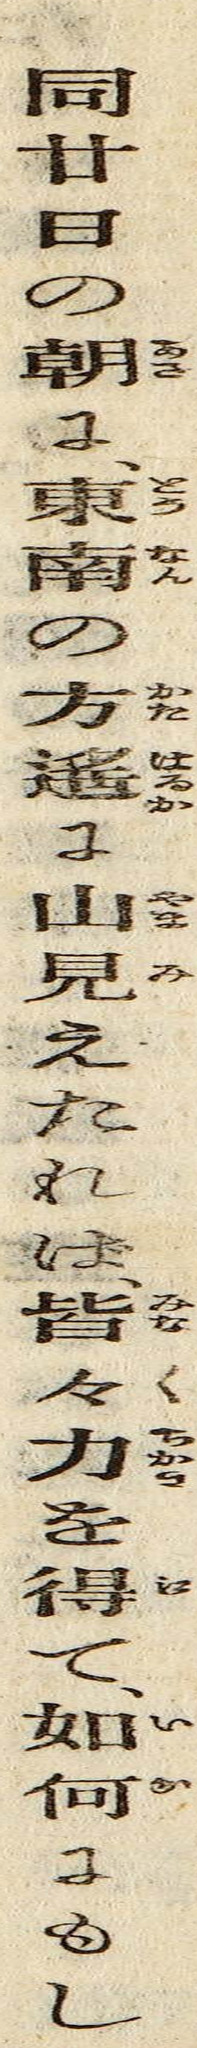同廿日の朝に、東南の方遥に山見えたれば、皆々力を得て、如何にもし
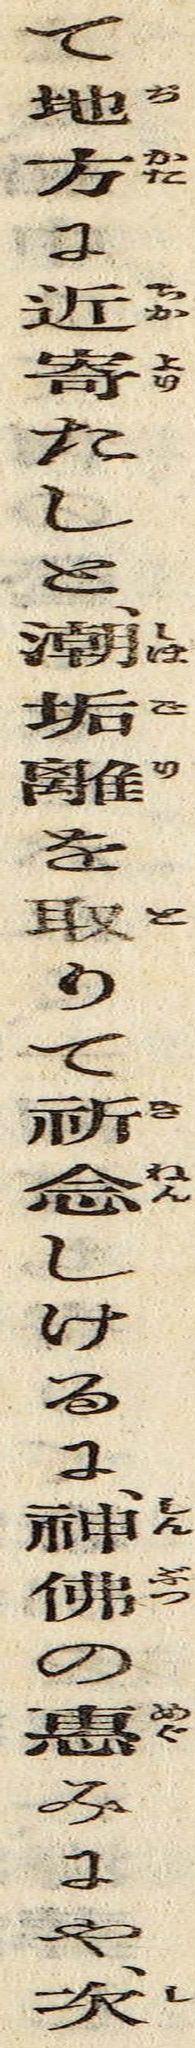て地方に近寄たしと、潮垢離を取りて祈念しけるに、神仏の恵みにや、次
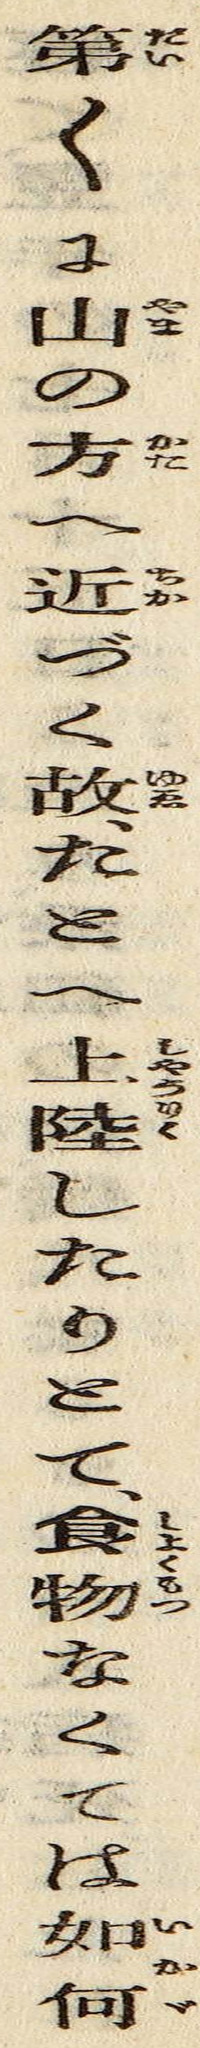第〳〵に山の方へ近づく故、たとへ上陸したりとて、食物なくては、如何
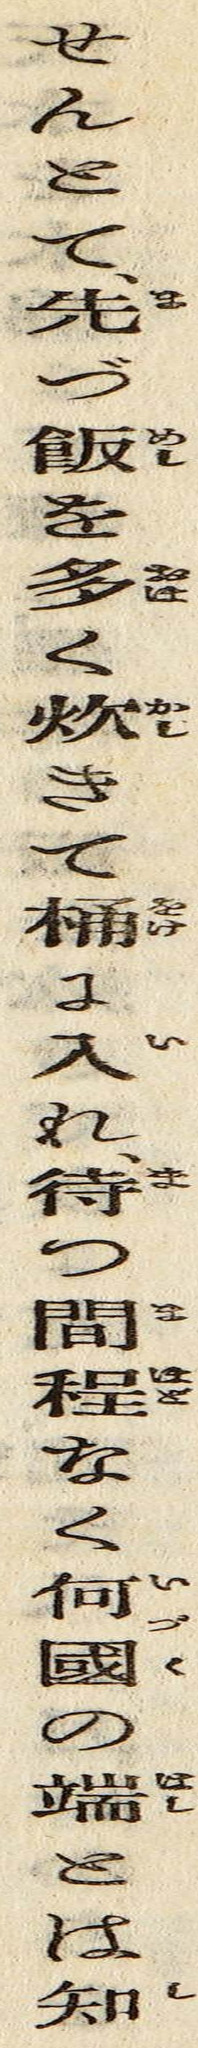せんとて、先づ飯を多く炊きて桶に入れ、待つ間程なく何国の端とは知
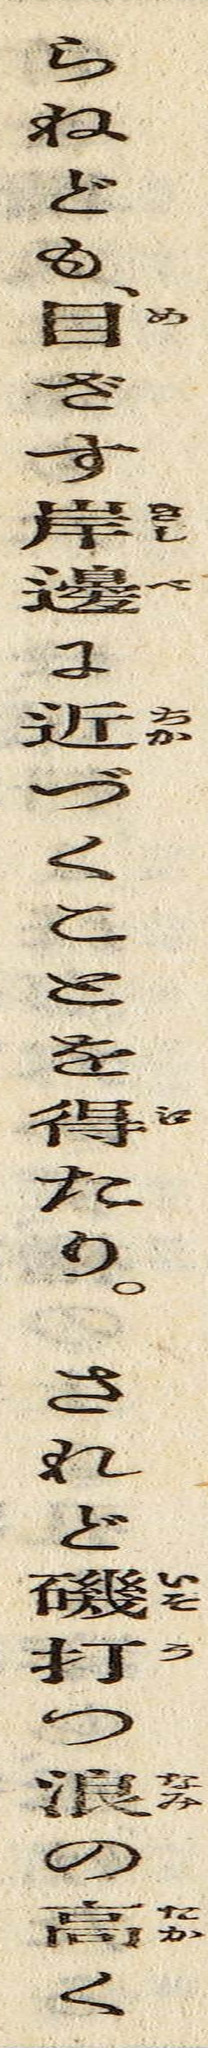らねめども、目ざす岸辺に近づくことを得たり。されど磯打つ浪の高く
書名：日本漂流譚
